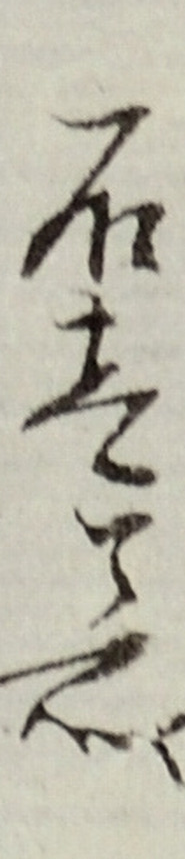石壱ケ所
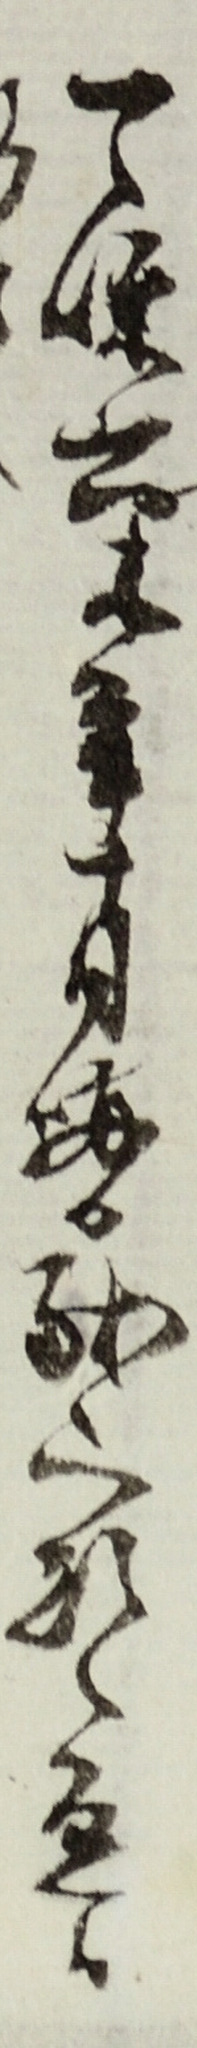天保六未年十月晦日献山願之通被

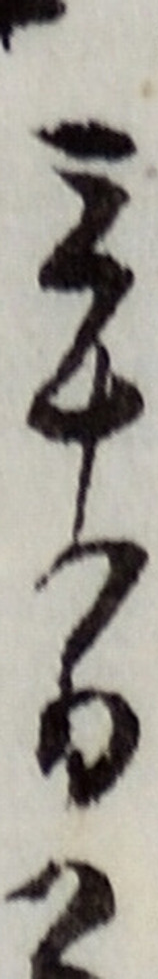三十郎
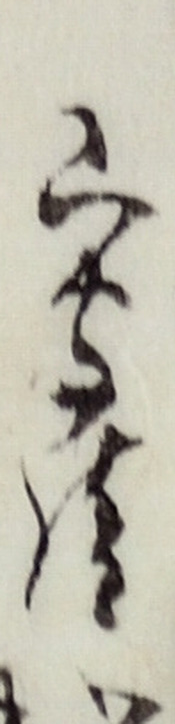山守請
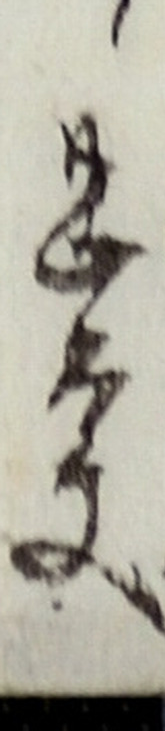忠太夫
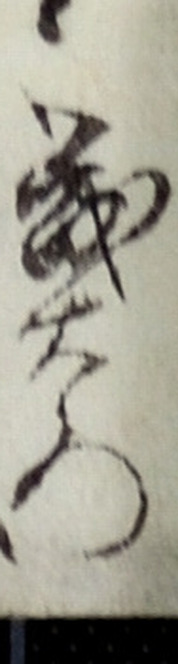茂右衛門
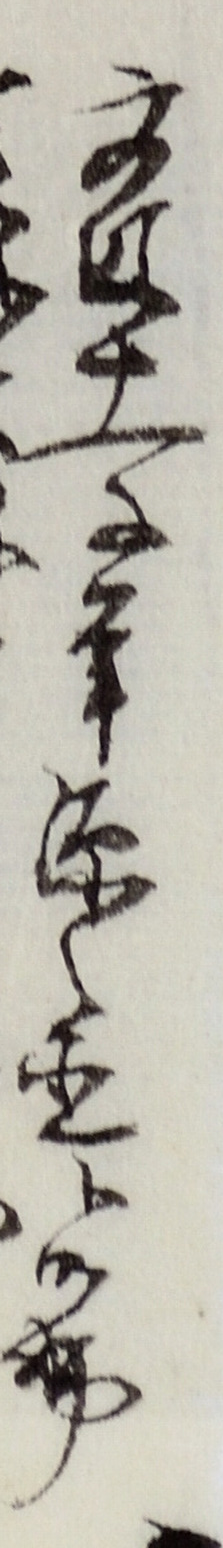文政十一子年源之丞え御払
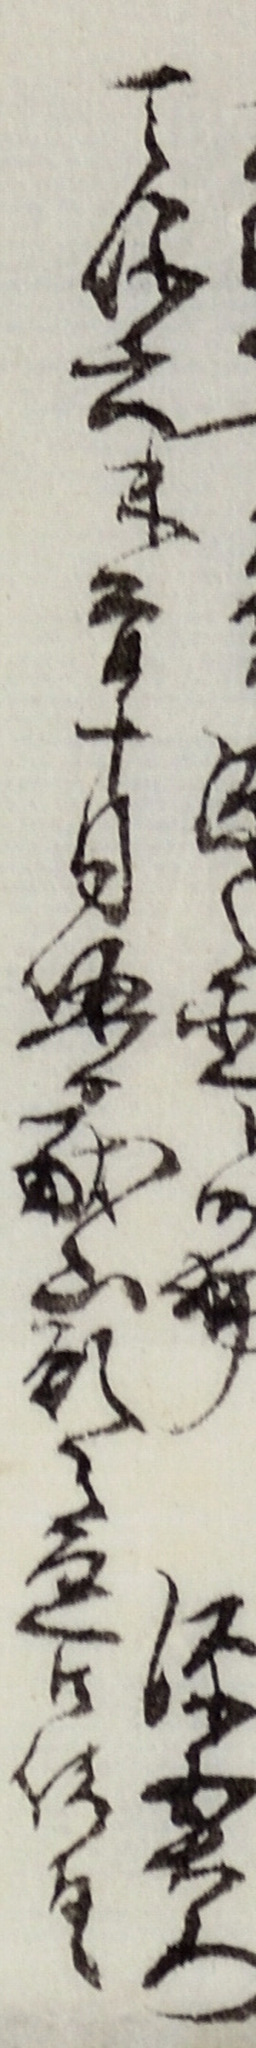天保六未年十月晦日献山願之通被仰付候
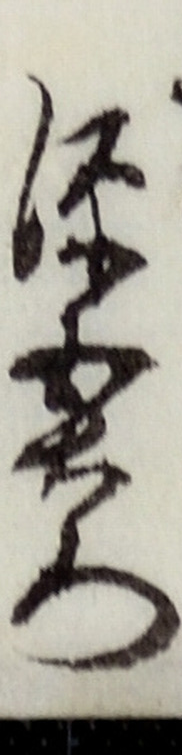源五右衛門
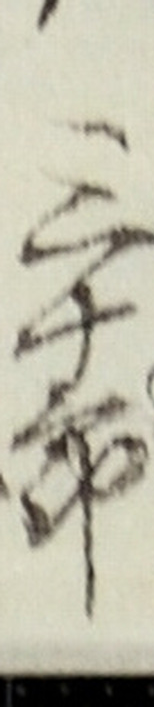三十郎
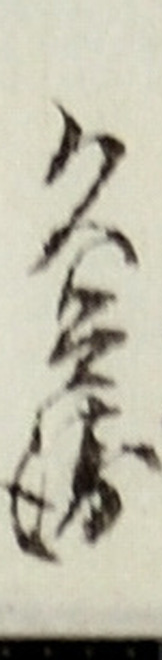久兵衛
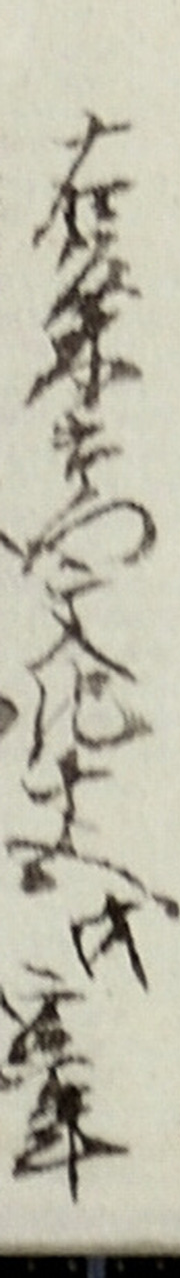右粂左衛門文化十五戊寅年
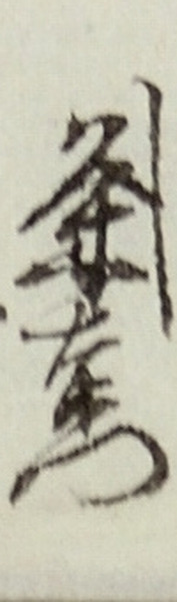茂右衛門
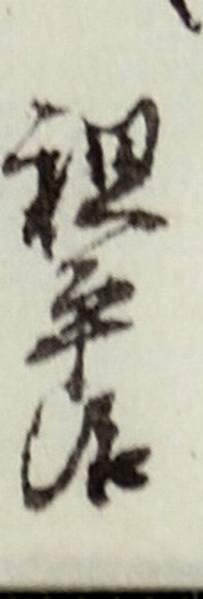祖平治
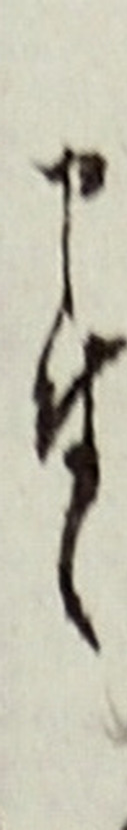申付候
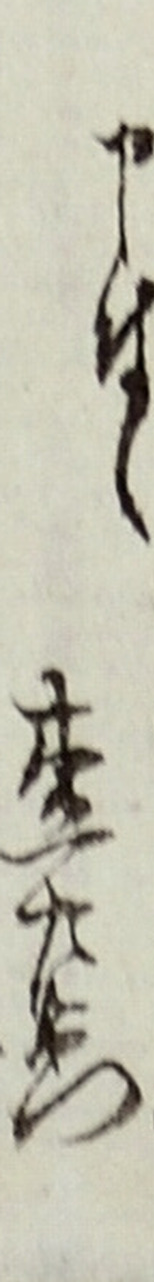申付候
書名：山林帳草稿
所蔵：伊那市立高遠町図書館・合同会社AMANE
